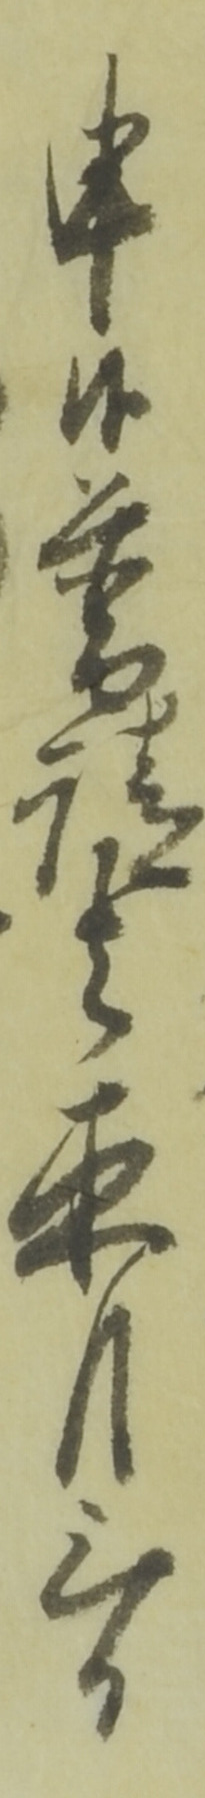申候普請は来月三日
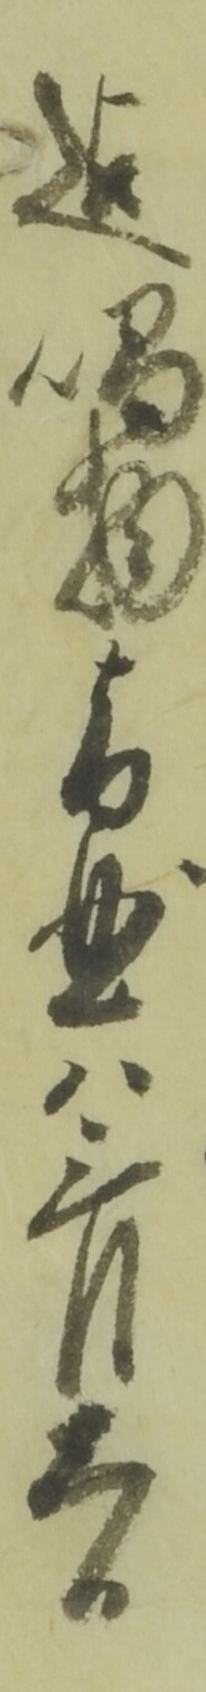迄鳴物音曲ハ三月三日
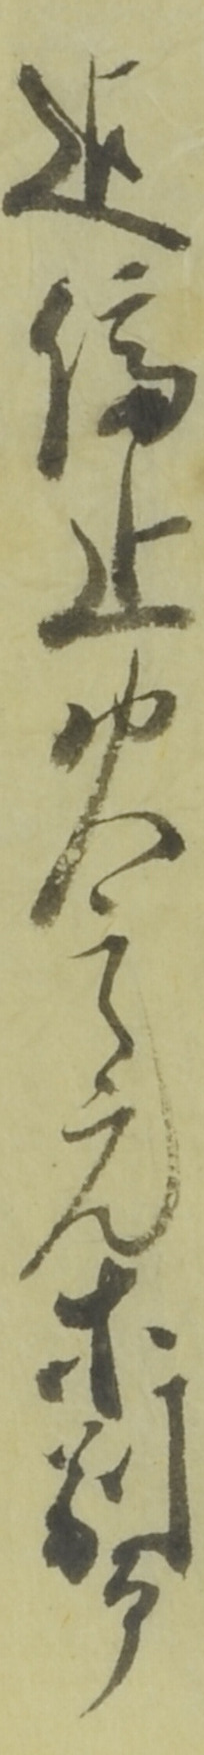迄停止火之元等別而

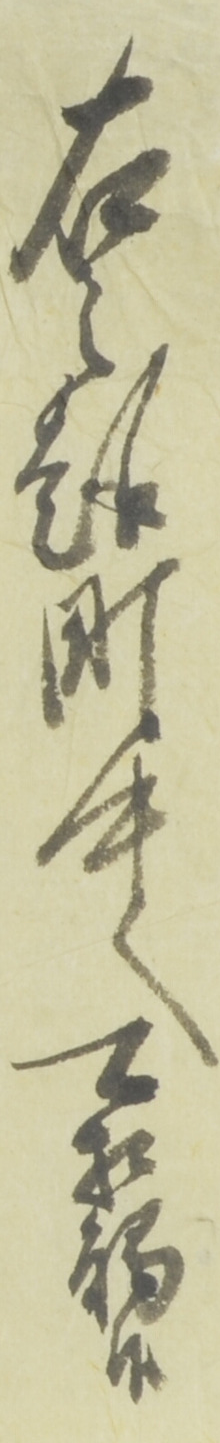右之趣町中へ可相触候
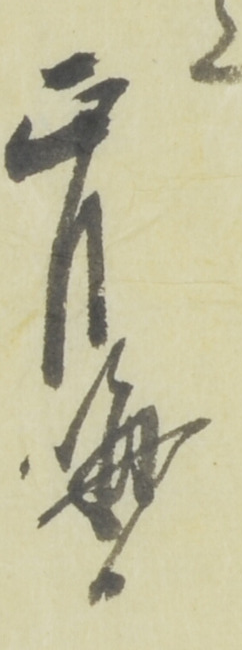正月晦日
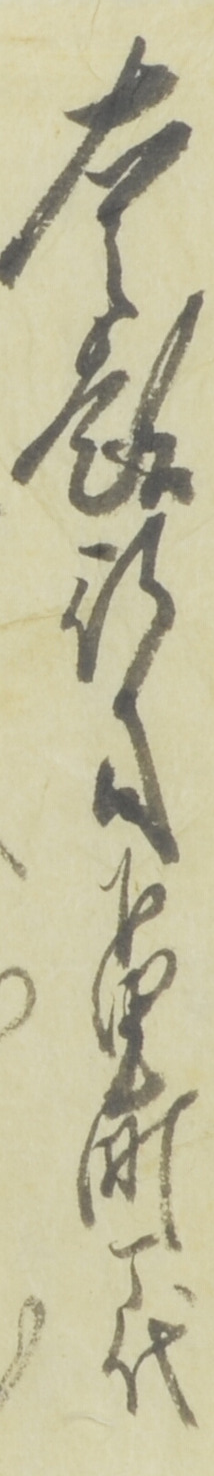右之趣行司下里町丁代
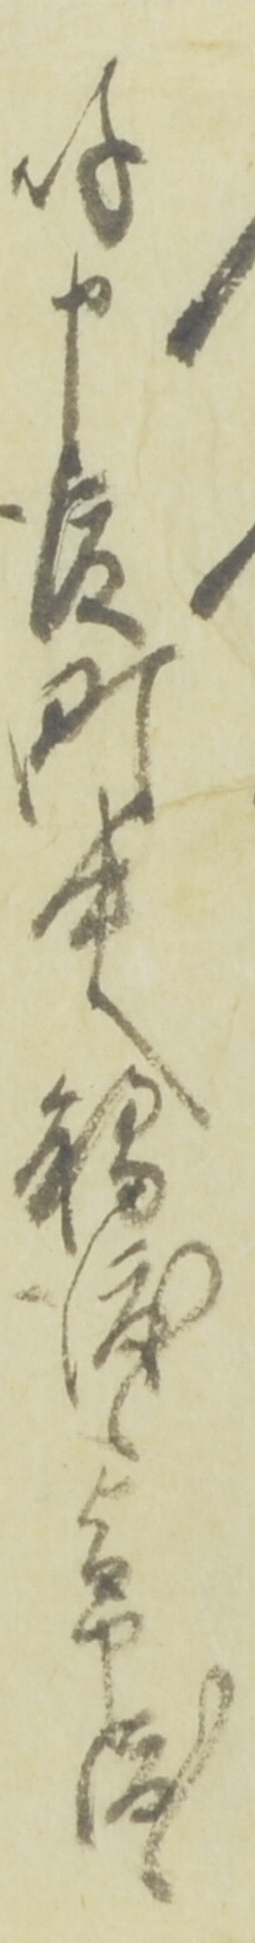呼申渡町中へ触渡候旨申渡候
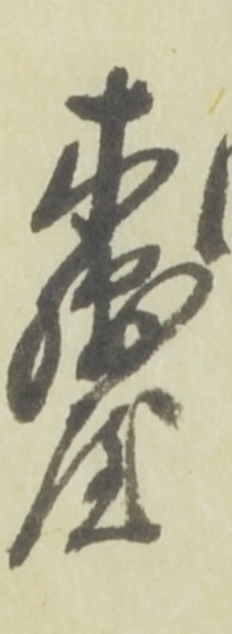木綿屋
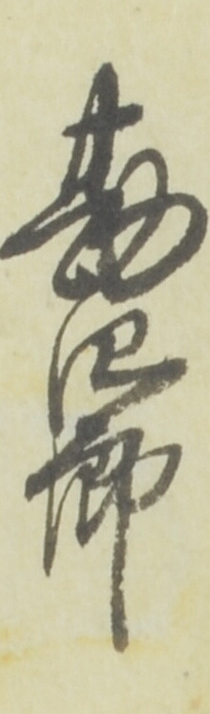勘四郎
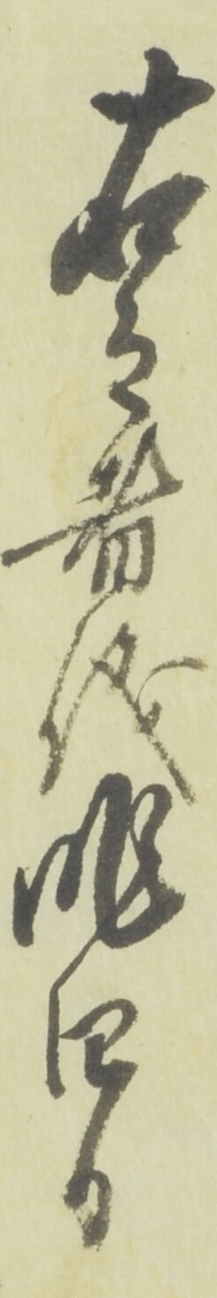右之者儀昨四日
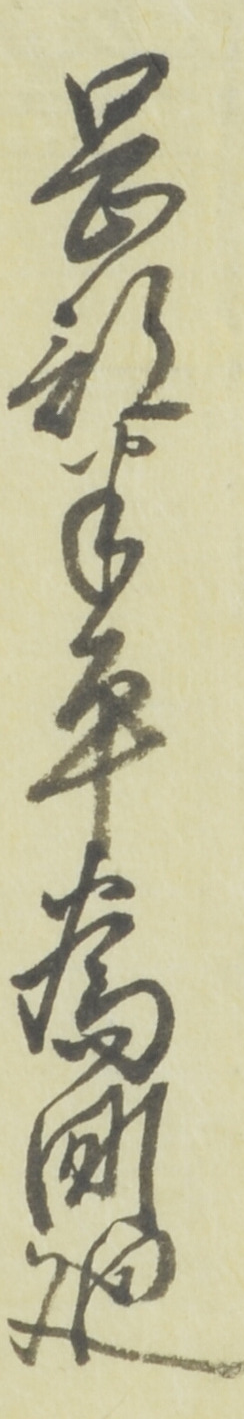岡部半平為町廻
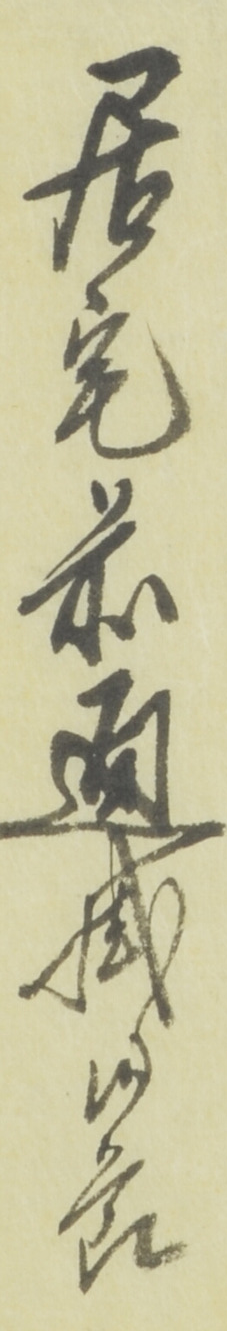居宅前通掛候節
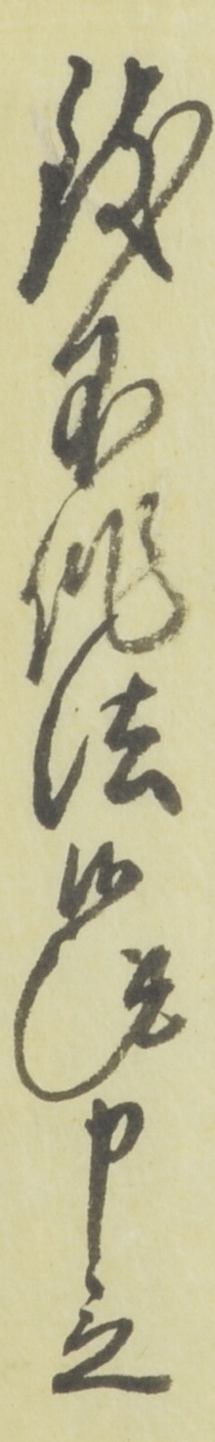致不作法候趣申立
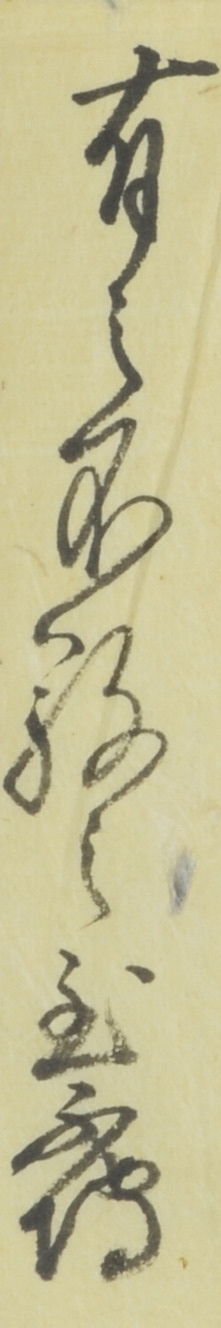有之不敬之至不埒
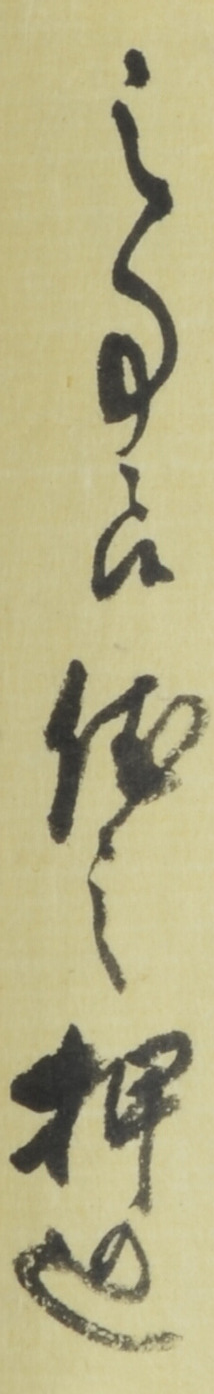之事ニ候依之押込
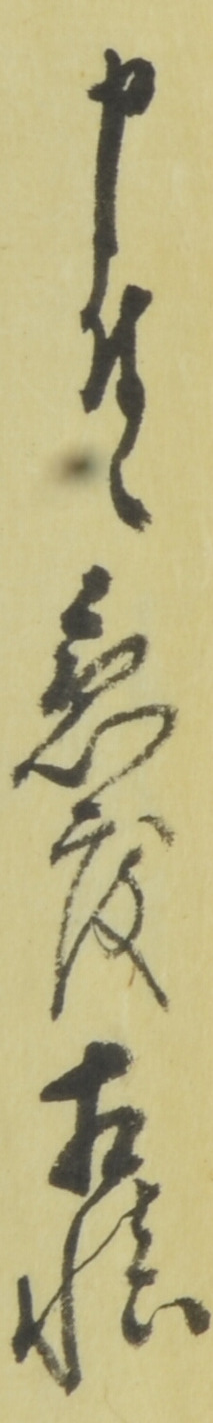申付候急度相慎
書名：御触書御書附控
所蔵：伊那市立高遠町図書館・合同会社AMANE
